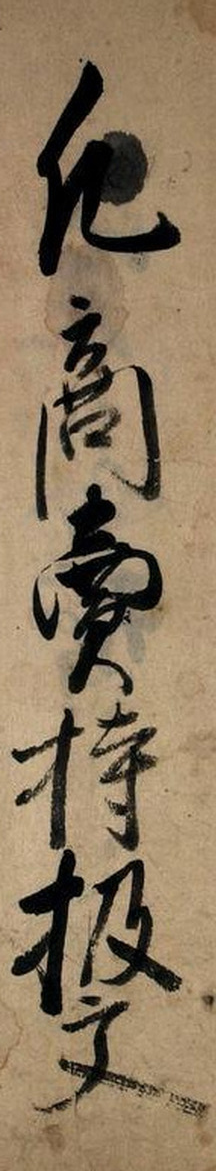凡商売持扱文
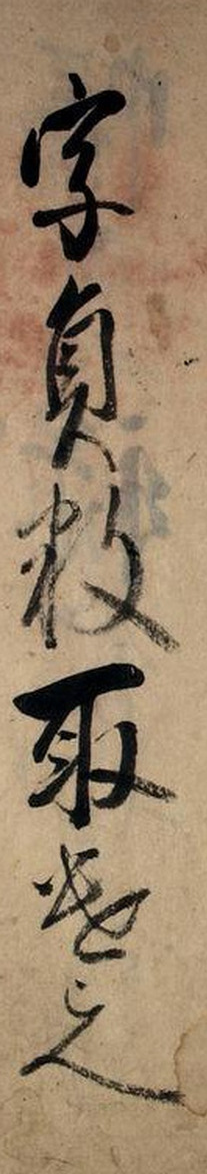字員数取遣之
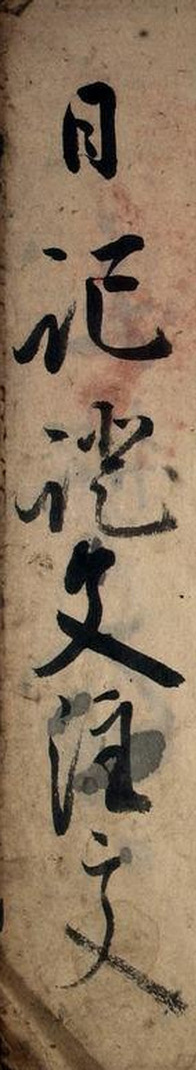日記証文注文

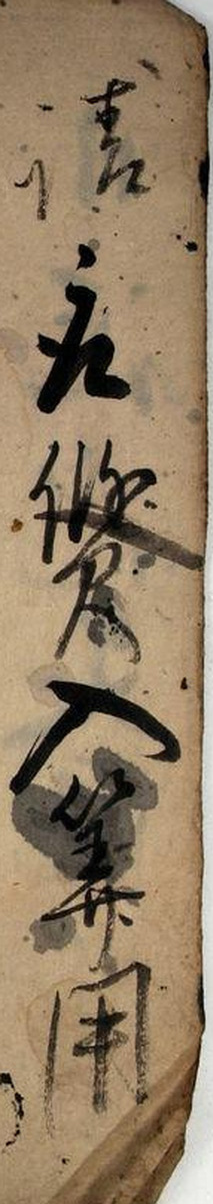請取質入算用
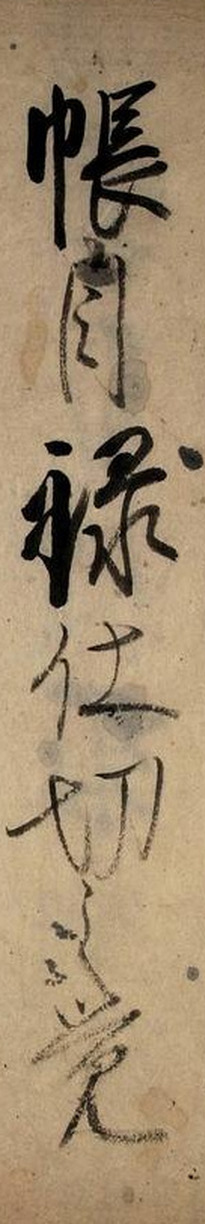帳目録切之覚
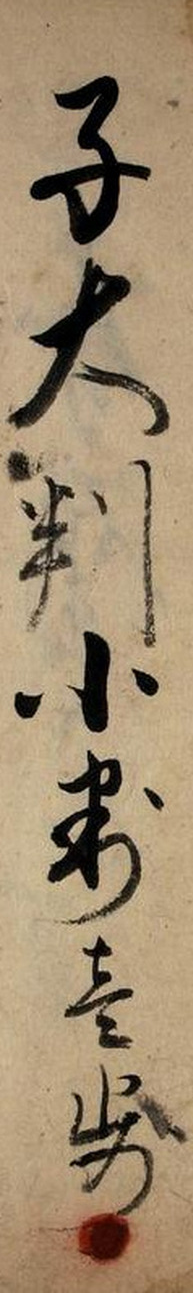子大判小判壱歩
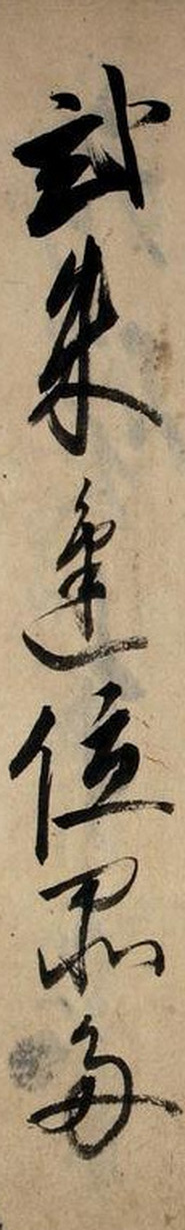弐朱金位品多
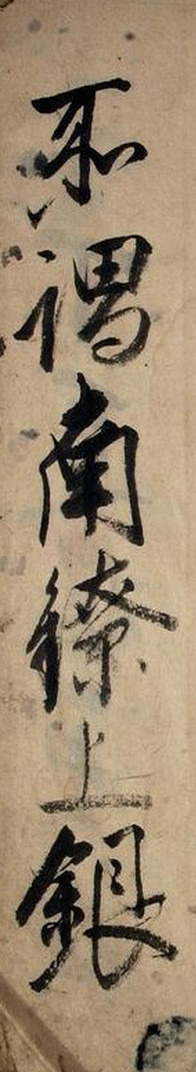所謂南鐐上銀

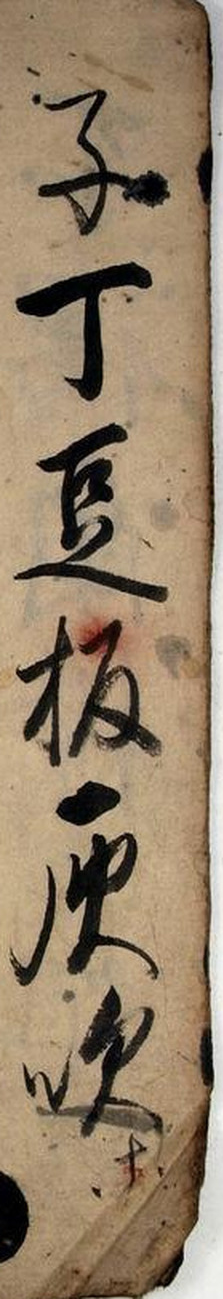子丁豆板灰吹等
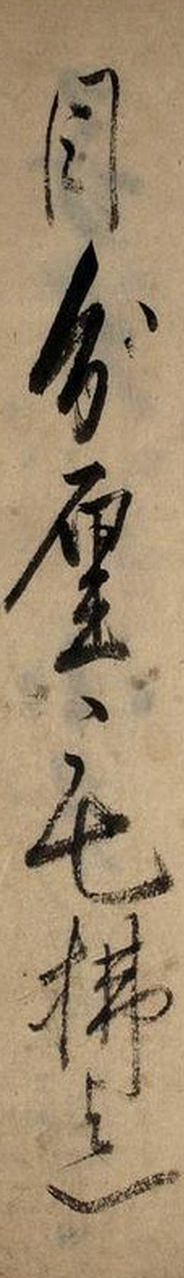目分厘毛払迄

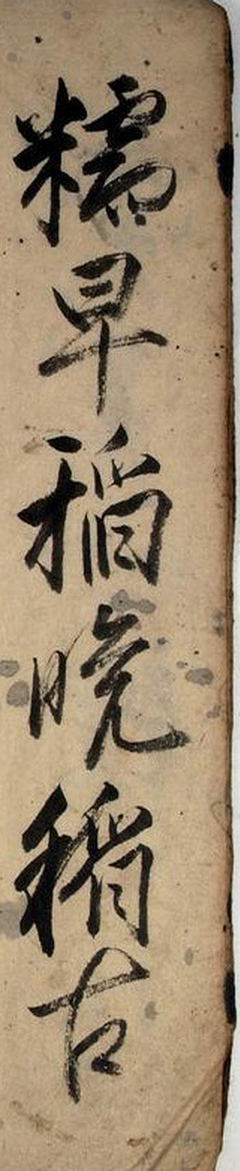糯早稲晩稲古
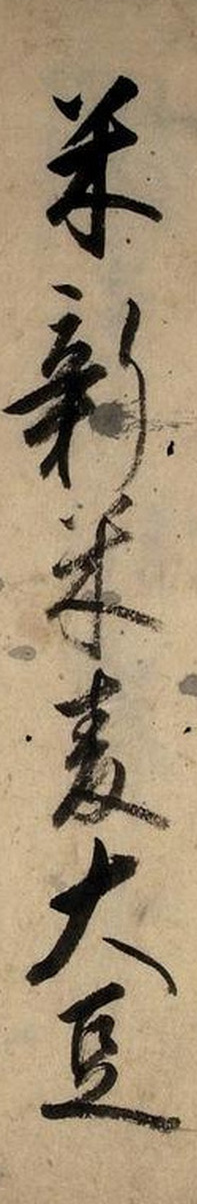米新米麦大豆
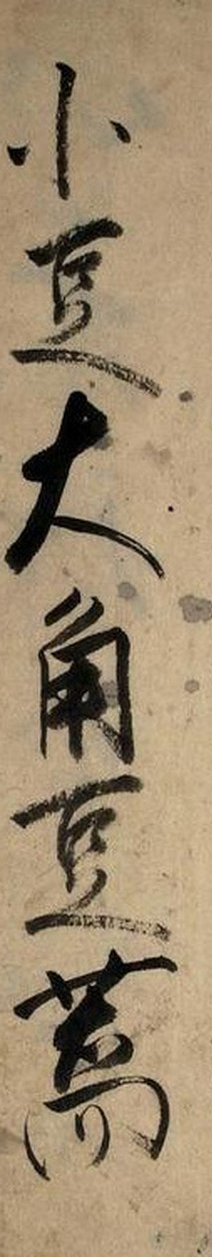小豆大角豆蕎
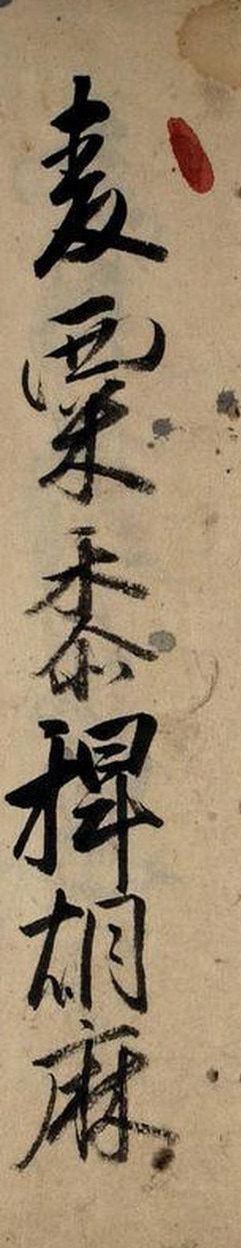麦粟黍稗胡麻
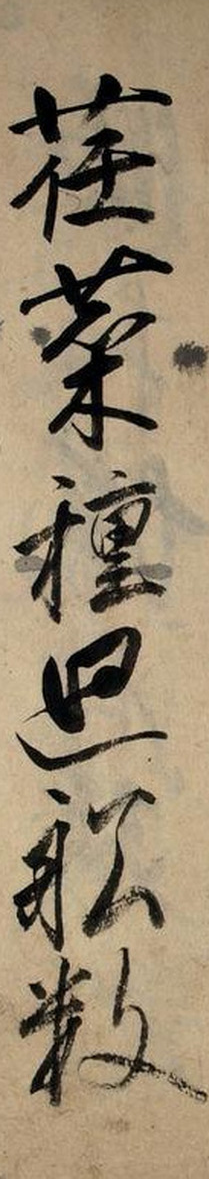荏菜種廻船数
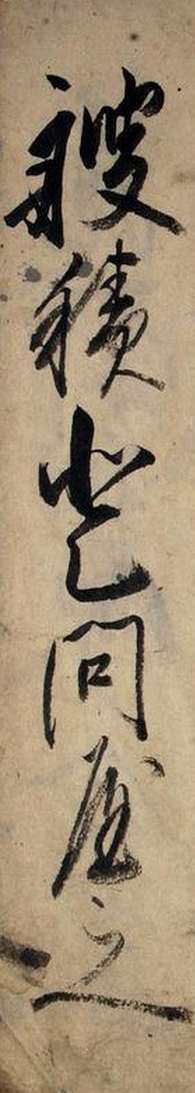艘積登問屋之
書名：商売往来（往来物、手習手本）
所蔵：福井県文書館 Fukui Prefectural Archives
